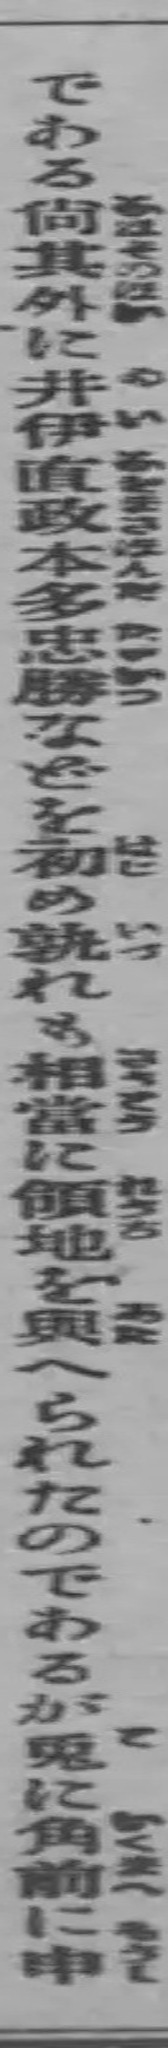である尚其外に井伊直政本多忠勝などを初め孰れも相当に領地を与へられたのであるが兎に角前に申
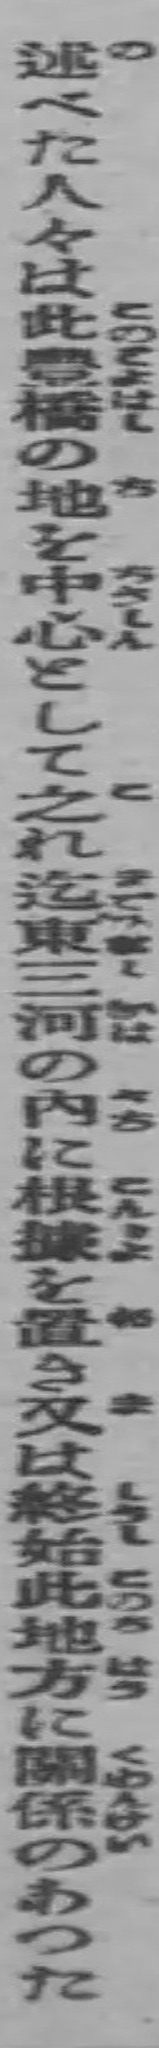述べた人々は此豊橋の地を中心として之れ迄東三河の内に根拠を置き又は終始此地方に関係のあつた
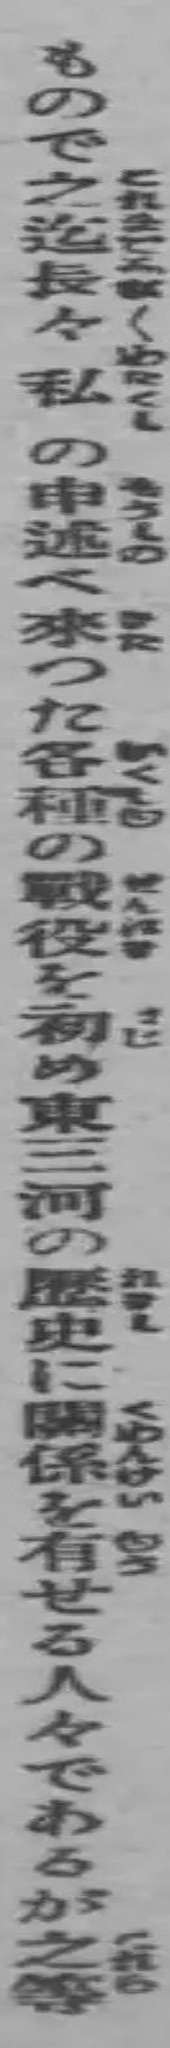もので之迄長々私の申述べ来つた各種の戦役を初め東三河の歴史に関係を有せる人々であるが之等
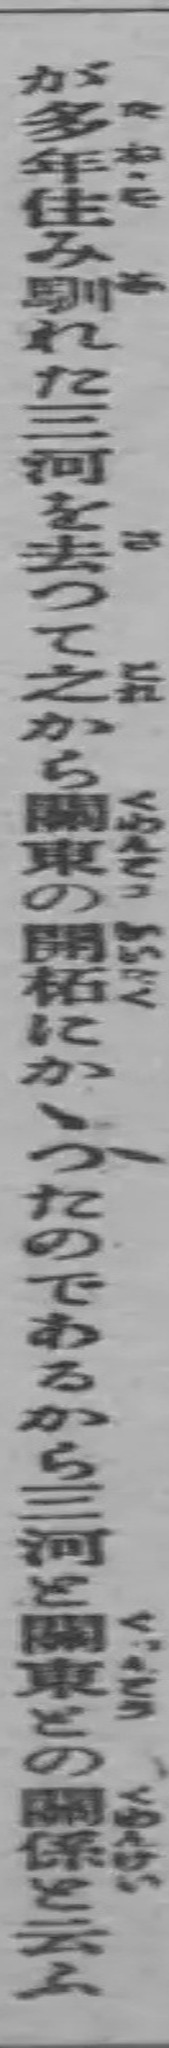が多年住み馴れた三河を去つて之から関東の開拓にかゝつたのであるから三河と関東との関係と云ふ
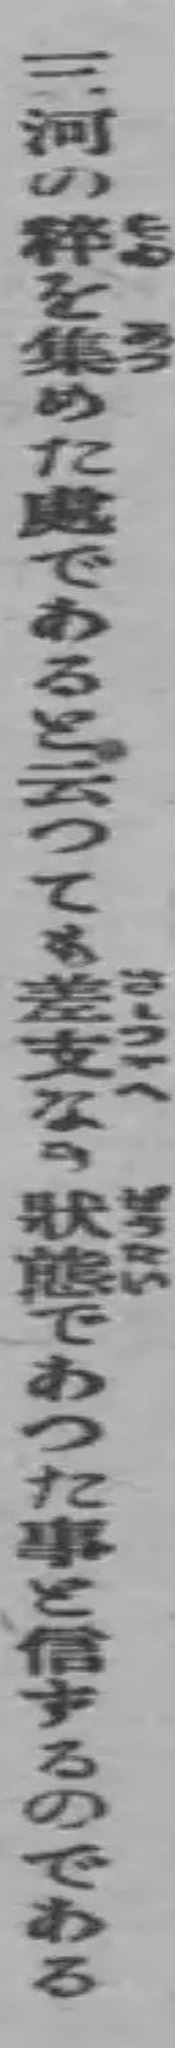たるもの三河の粋を集めた処であると云つても差支なき状態であつた事と信ずるのである
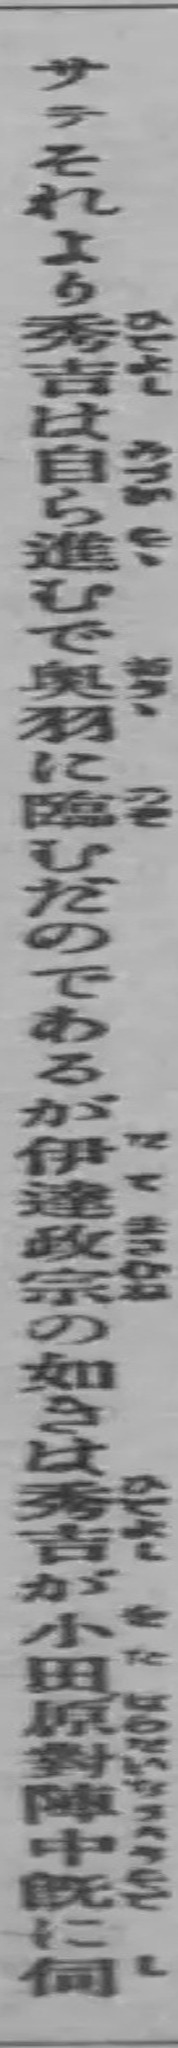奥羽の平定サテそれより秀吉は自ら進むで奥羽に臨むだのであるが伊達政宗の如きは秀吉が小田原対陣中既に伺
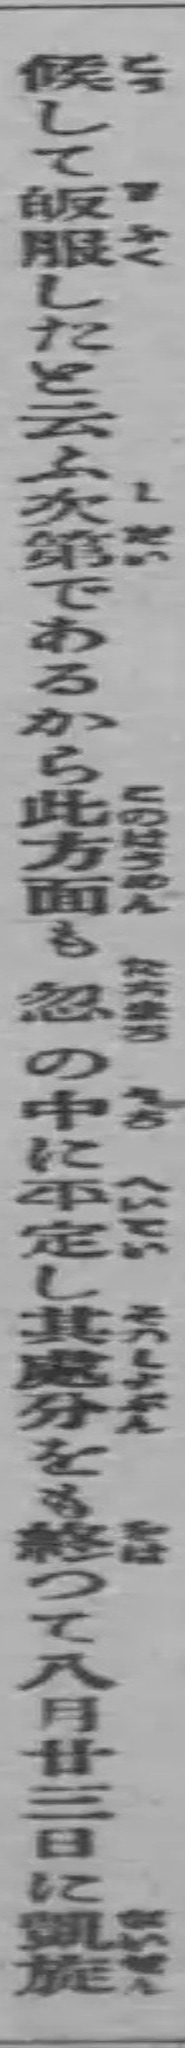候して皈服したと云ふ次第であるから此方面も忽の中に平定し其処分をも終つて八月廿三日に凱旋
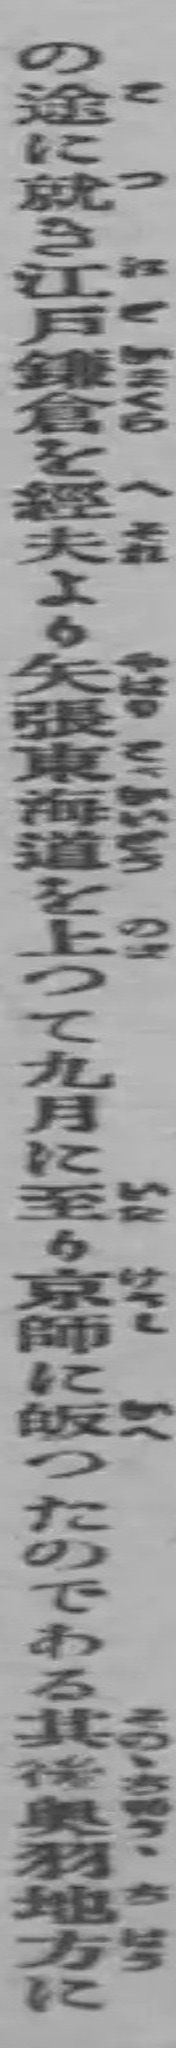の途に就き江戸鎌倉を経夫より矢張東海道を上つて九月に至り京師に皈つたのである其後奥羽地方に
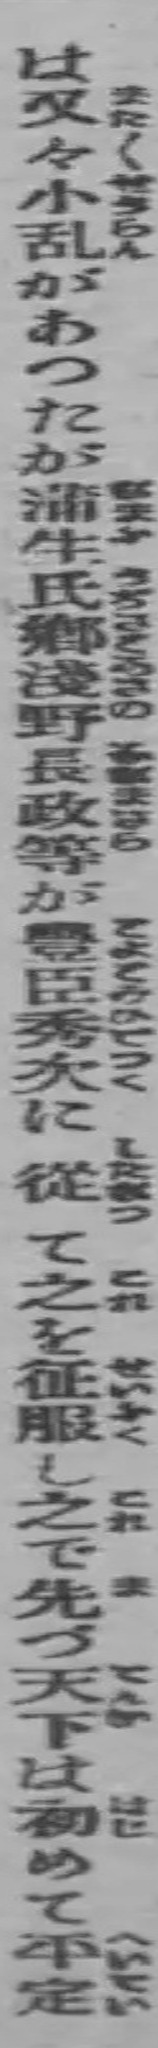は又々小乱があつたが蒲生氏郷浅野長政等が豊臣秀次に従て之を征服し之で先づ天下は初めて平定
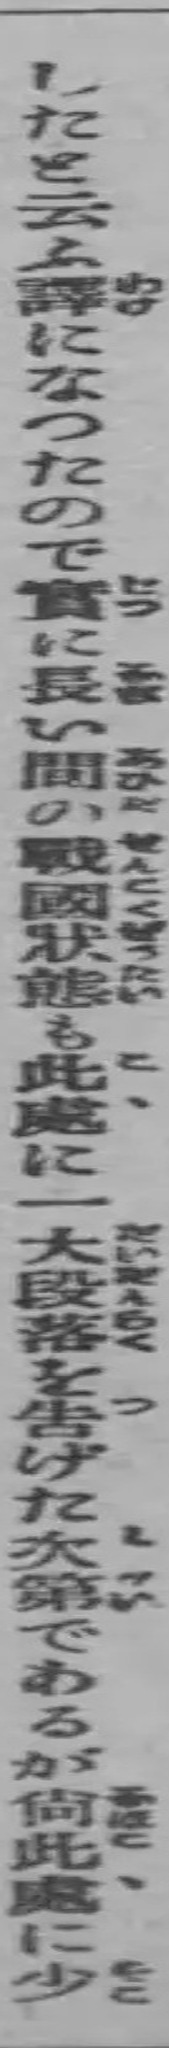したと云ふ訳になつたので実に長い間の戦国状態も此処に一大段落を告げた次第であるが尚此処に少
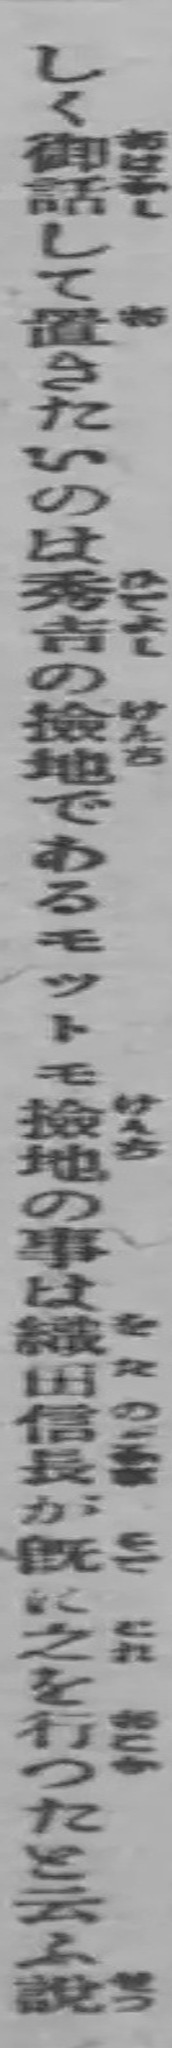しく御話して置きたいのは秀吉の検地であるモツトモ検地の事は織田信長が既に之を行つたと云ふ説
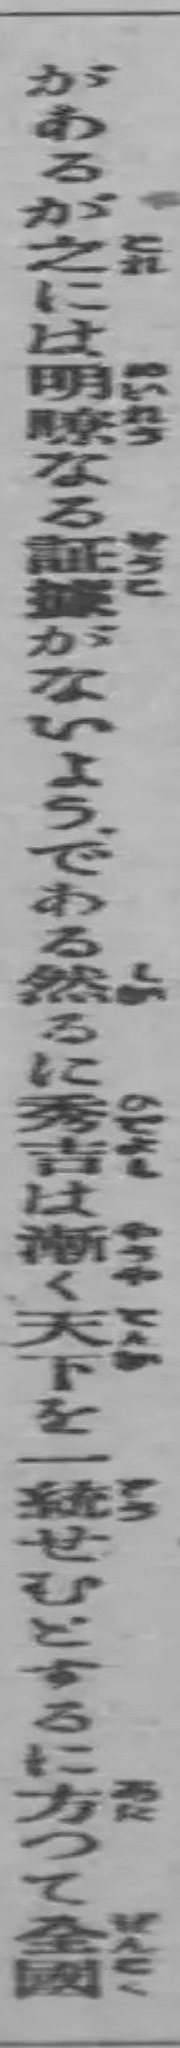があるが之には明瞭なる証拠がないようである然るに秀吉は漸く天下を一統せむとするに方つて全国
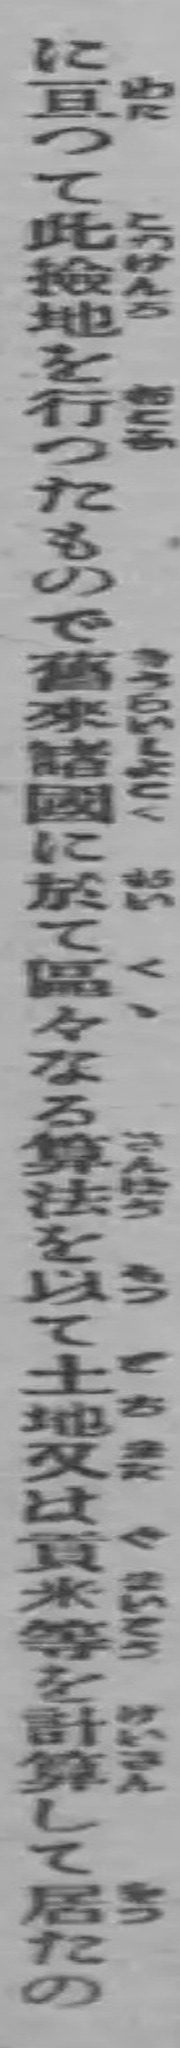秀吉の検地に亘つて此検地を行つたもので旧来諸国に於て区々なる算法を以て土地又は貢米等を計算して居たの
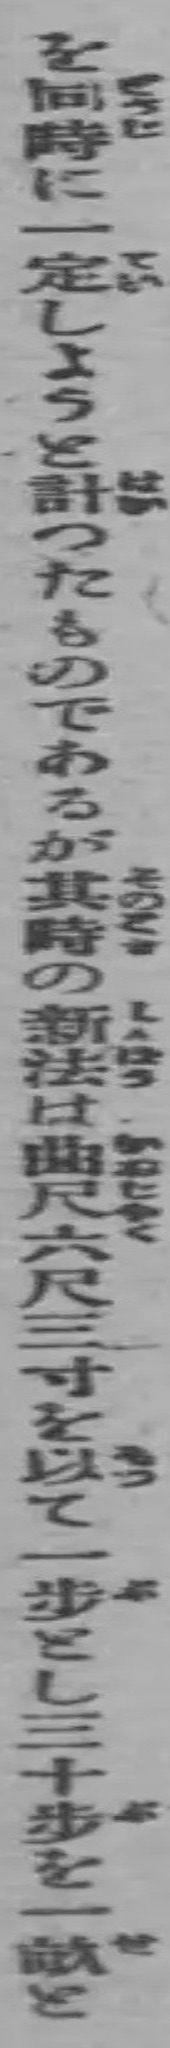を同時に一定しようと計つたものであるが其時の新法は曲尺六尺三寸を以て一歩とし三十歩を一畝と

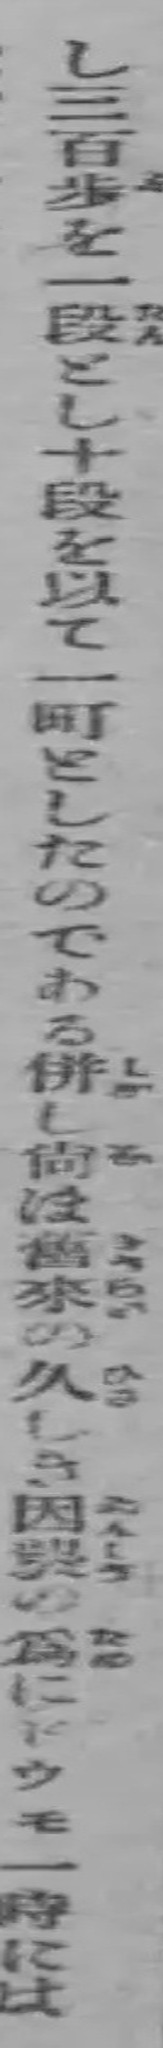し三百歩を一段とし十段を以て一町としたのである併し尚ほ旧来の久しき因襲の為にドウモ一時には
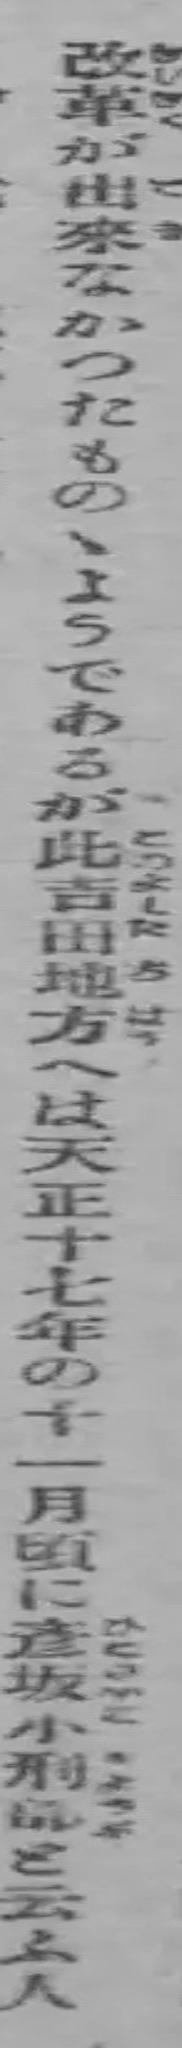改革が出来なかつたものゝようであるが此吉田地方へは天正十七年の十一月頃に彦坂小刑部と云ふ人
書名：豊橋市史談
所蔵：国立国会図書館 National Diet Library, JAPAN
